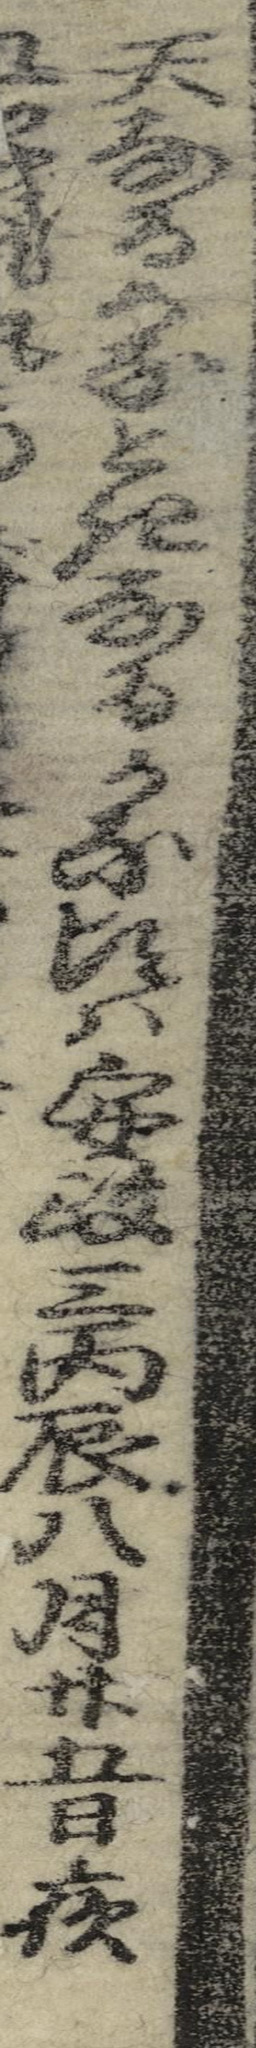天なるかなときなるかな頃は安政三丙辰八月廿五日夜
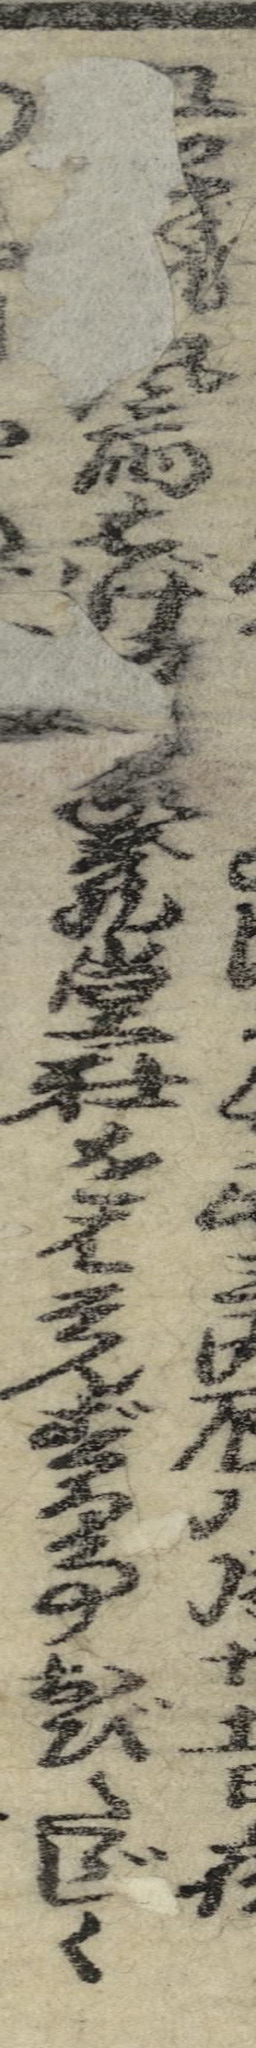風雨はげ家蔵堂社をはそんずる事おびたゞしく
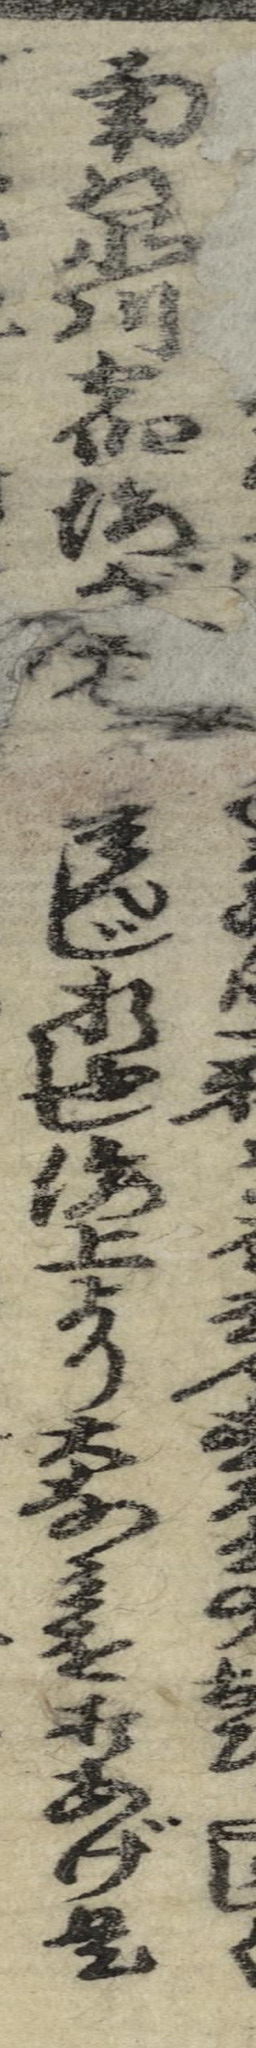南は品川宿海がそんじ折ふし海上より大なみを打あげ是
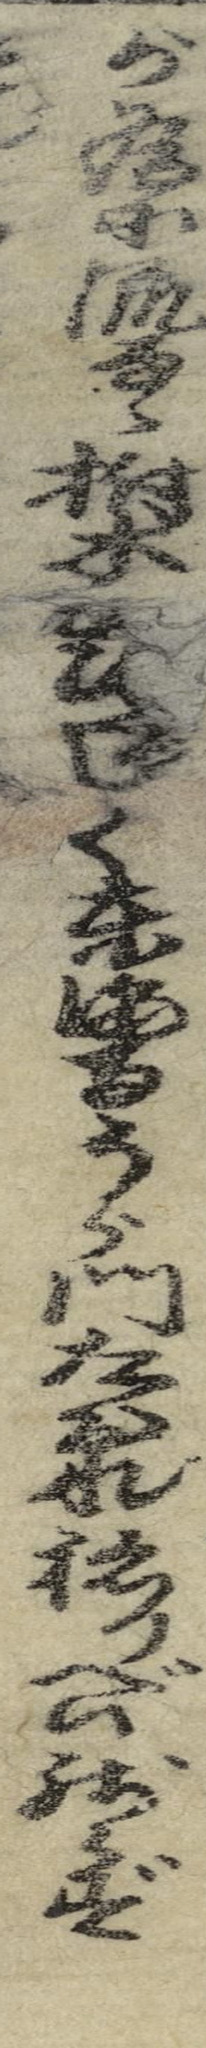が為に流るゝ樹木おびたゞしく東海寺うら門たおれねりべい残らず
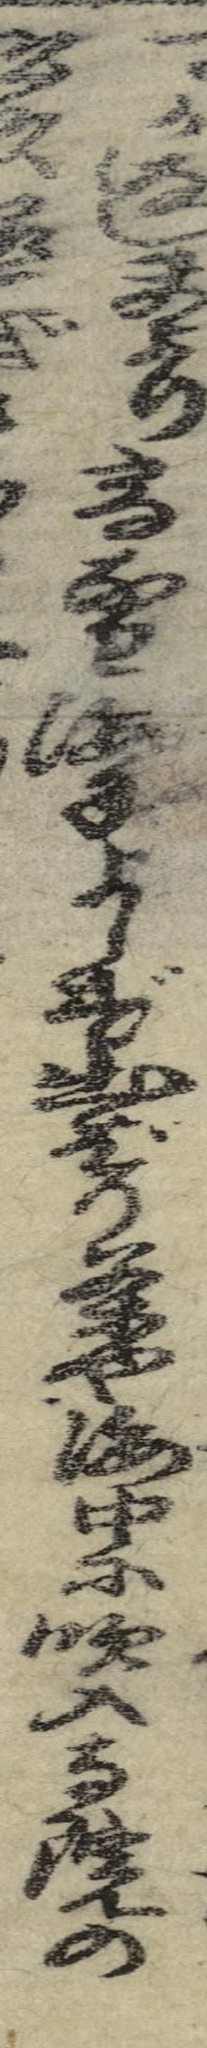つゝがなし夫より高なわ海手よしず出ばり茶や海中に吹入寺院の
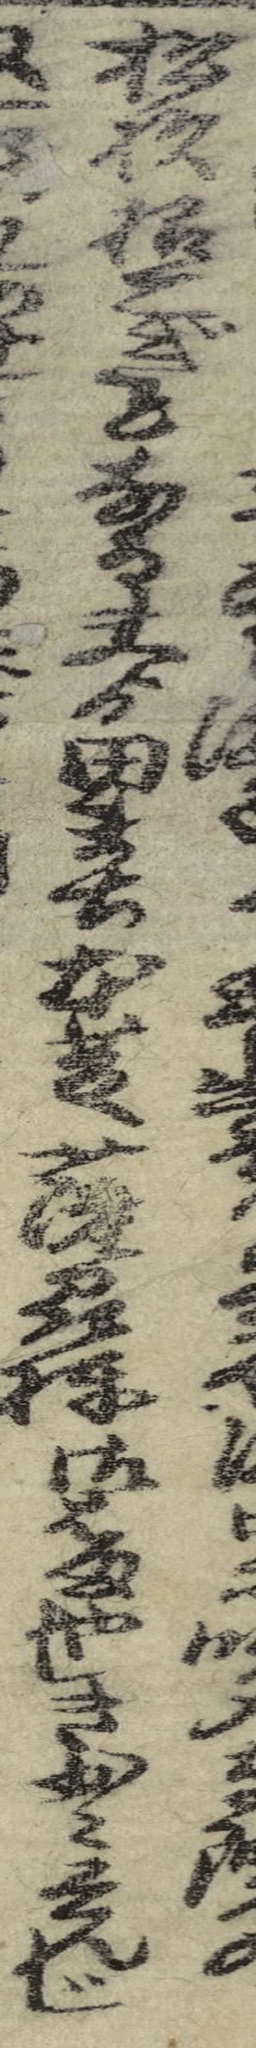松杉根こぎとなる夫ゟ田まち本所薩州様御はまやしき少々そんじ
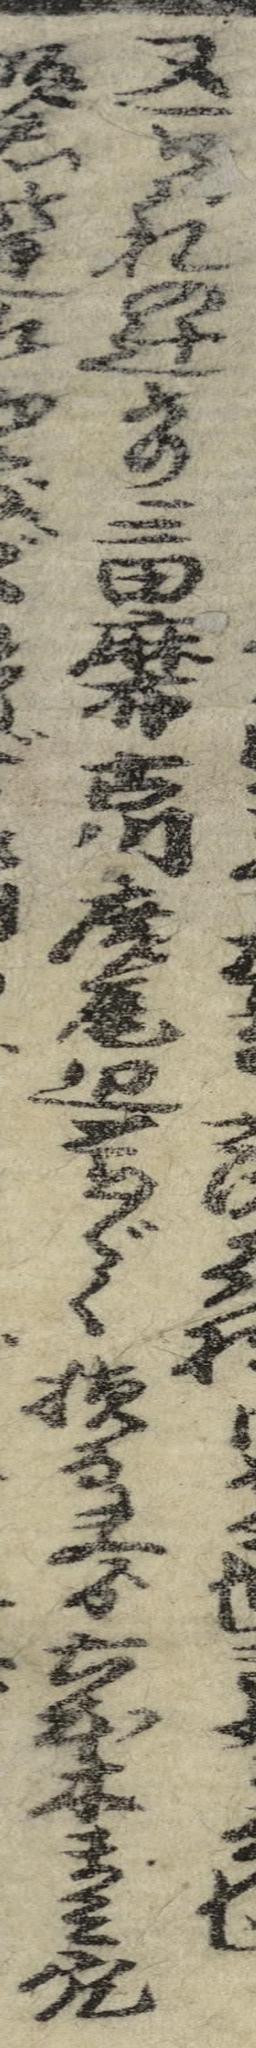又一口は札の辻より三田麻布古川広尾辺こと〴〵く損る夫ゟ六本木まみ穴
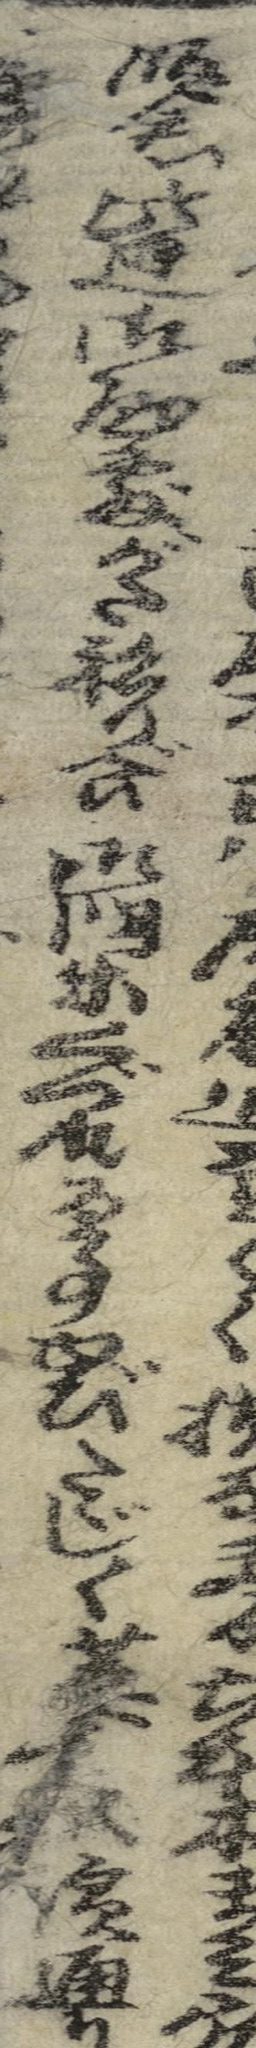飯倉此辺御屋敷がたねりべい御門等くづれる事おびたゞしく芝浜通り
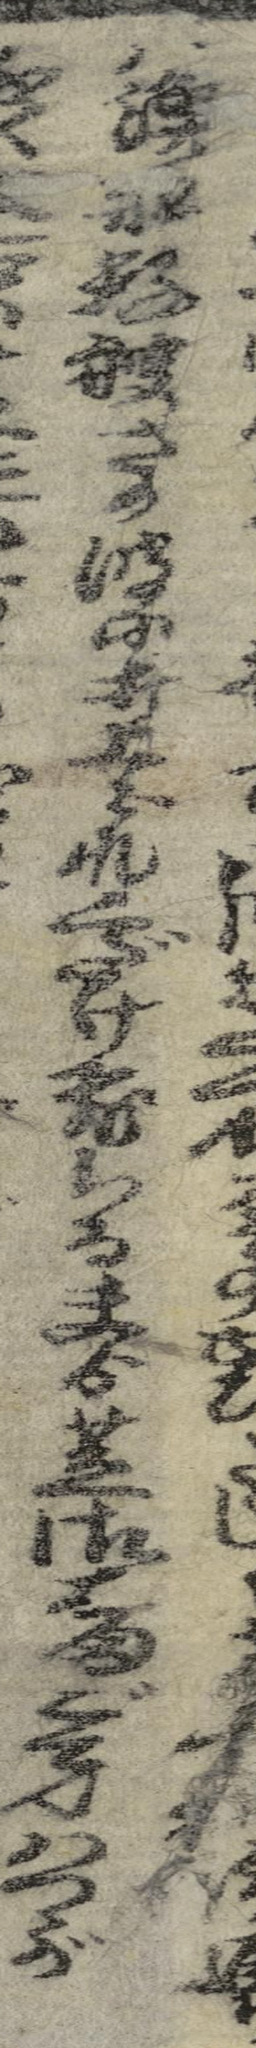は漁船数艘さか波に打上げられくだけ飛ちる夫ゟ芝御はまごてんはつゝが
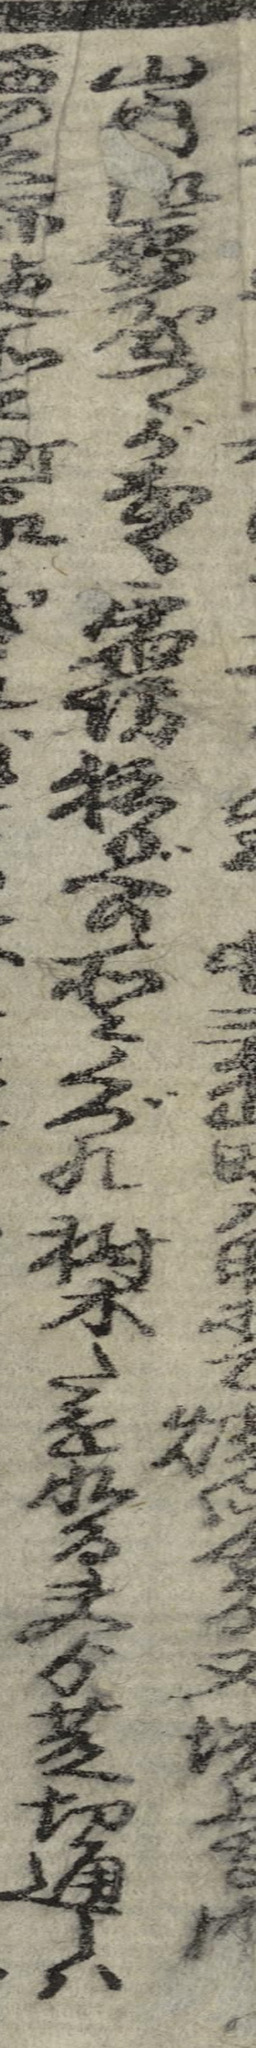山内御霊屋つゝがなく宿坊ねりべい所々くづれ樹木たをれる夫ゟ芝切通しは
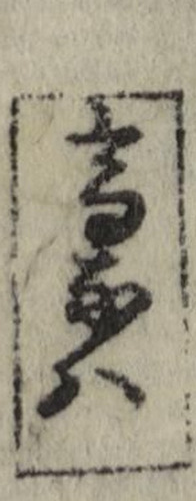高なは
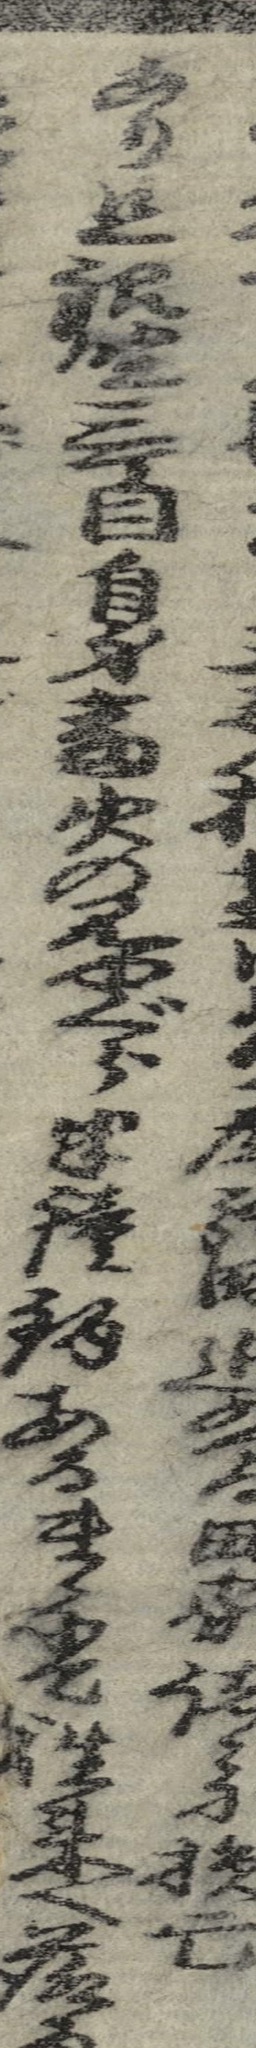あり且銀座三丁目自身番火の見やぐら半鐘釣あるまゝにて往来へ落る
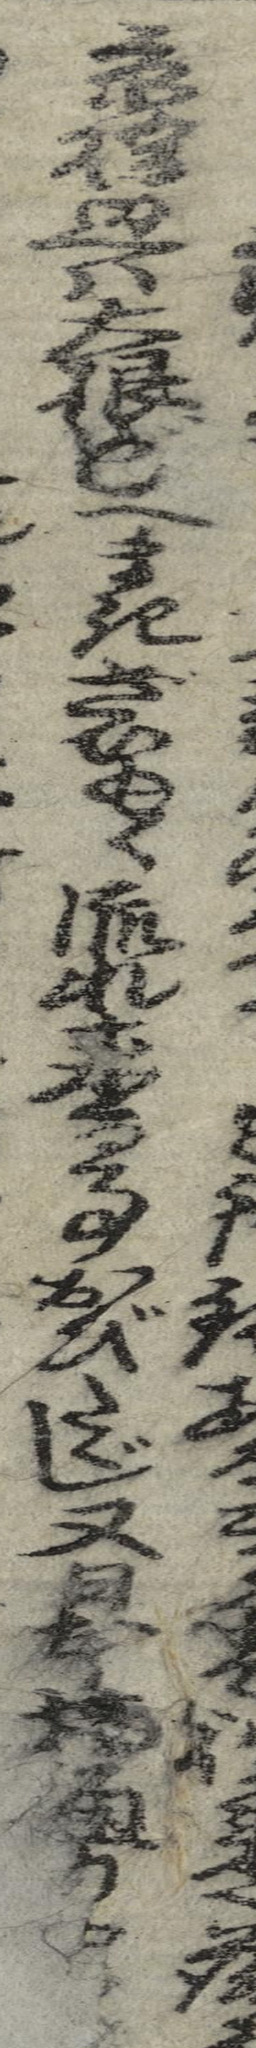京橋辺は大根がしへまきざいもく流れ来る事おびたゞし又日本橋通り
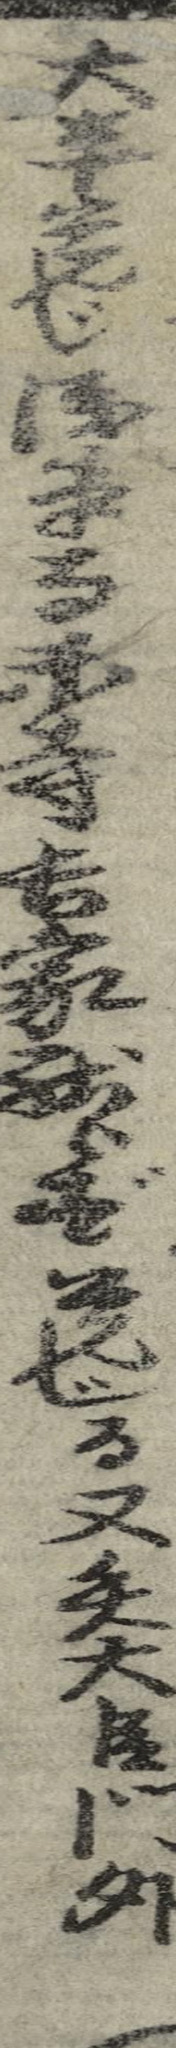大半そんじ浅草寺末寺長家残らずそんじる又矢大臣門外
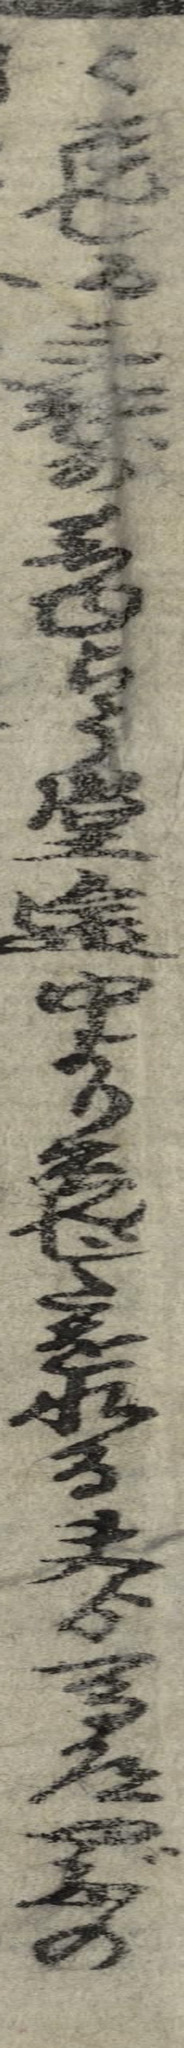くそんじる三社前しゆらう堂途中よりそんじたをれる夫ゟ馬道やぶの
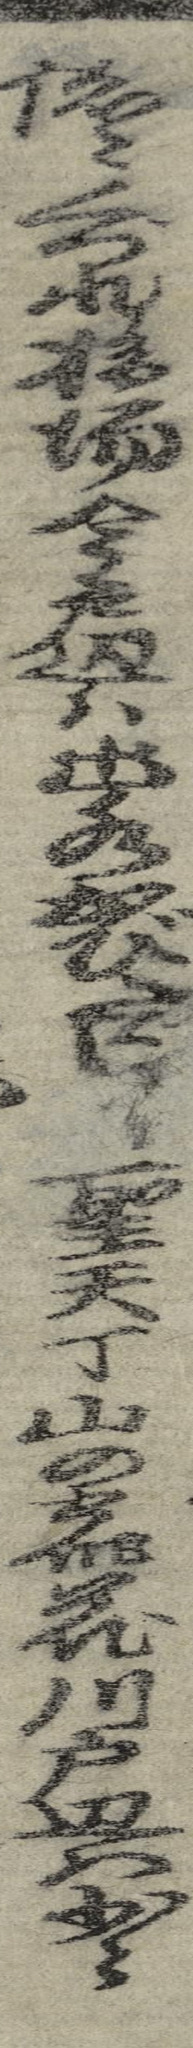諸々くづれ橋場今戸辺は出水おびたゞしく聖天丁山の宿花川戸辺は少々
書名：江戸近在　大風出水焼場附
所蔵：東京大学地震研究所図書室 Earthquake Research Institute Library, The University of Tokyo, JAPAN
